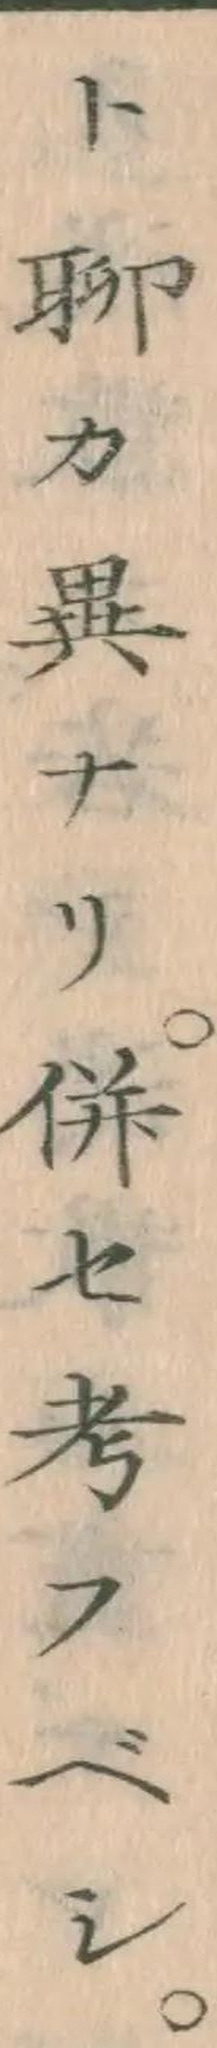ト聊カ異ナリ。併セ考フベシ。
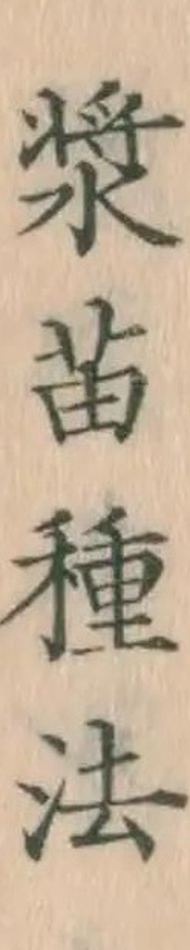漿苗種法
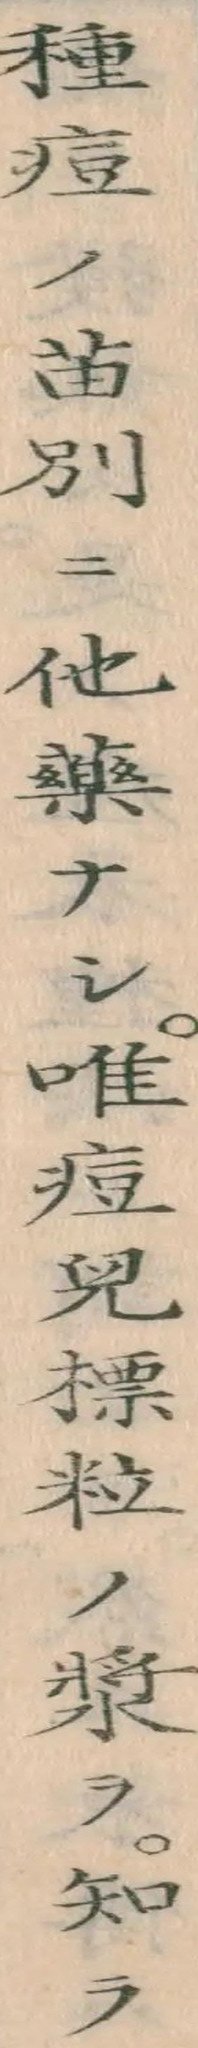種痘ノ苗別ニ他薬ナシ。唯痘児標粒ノ漿ヲ。知ラ
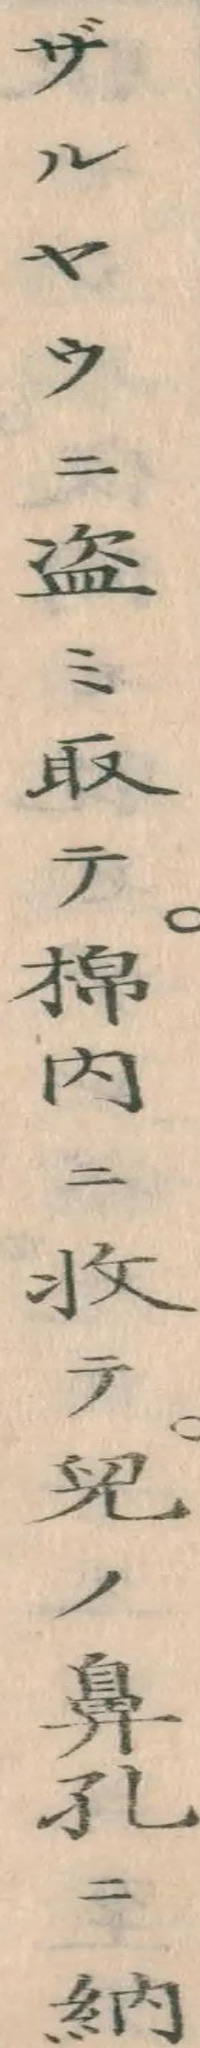ザルヤウニ盗ミ取テ。棉内ニ収テ。児ノ鼻孔ニ納
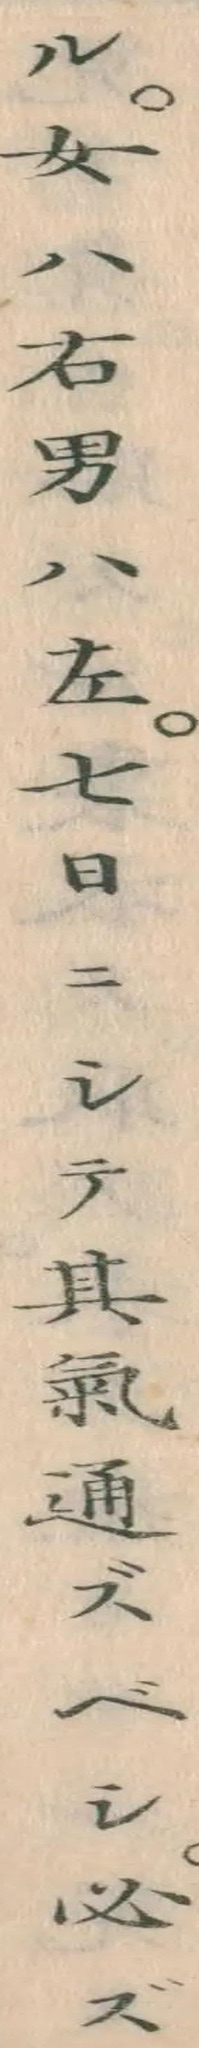ル。女ハ右男ハ左。七日ニシテ其気通ズベシ。必ズ
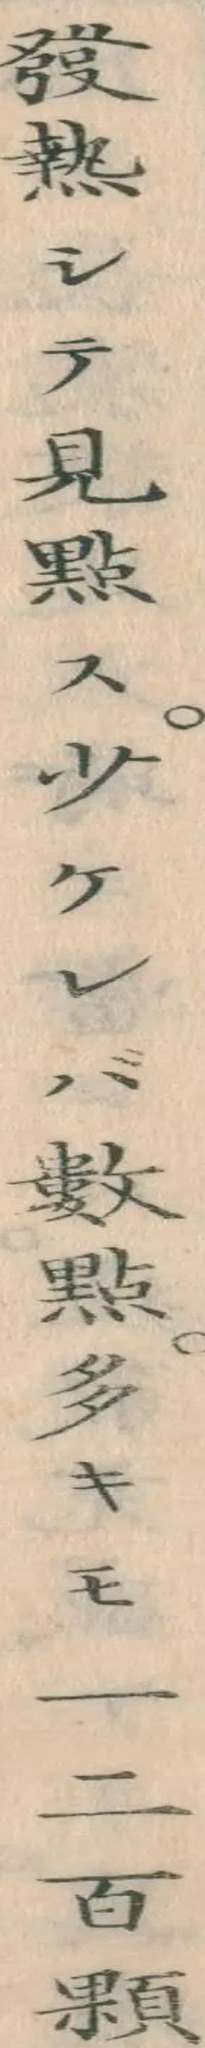発熱シテ見点ス。少ケレバ数点。多キモ一二百顆
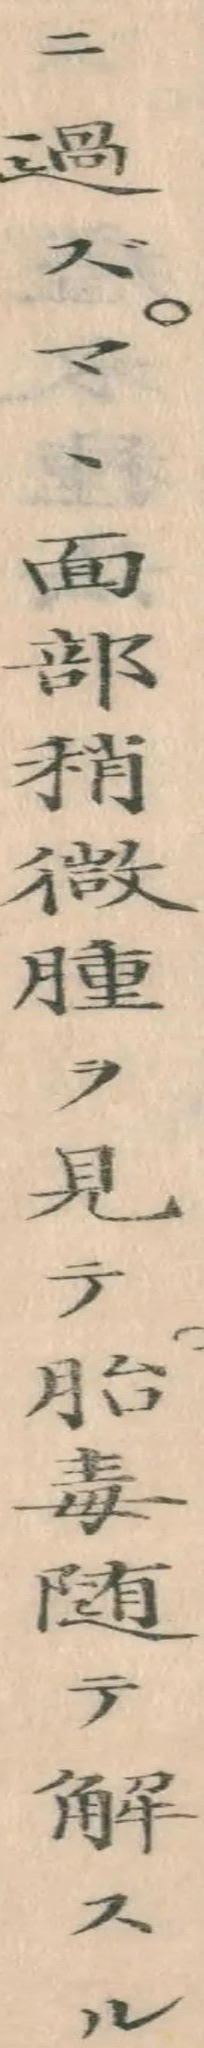ニ過ズ。マヽ面部稍微腫ヲ見テ。胎毒随テ解スル
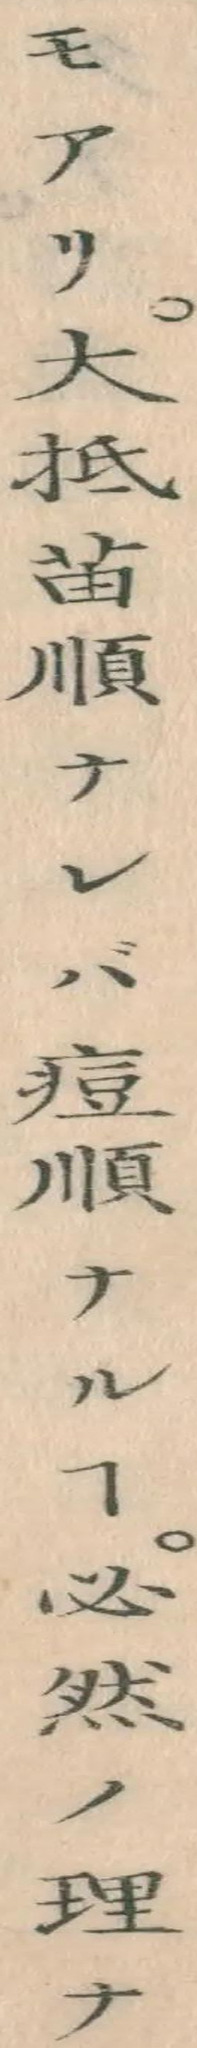モアリ。大抵苗順ナレバ痘順ナルヿ。必然ノ理ナ
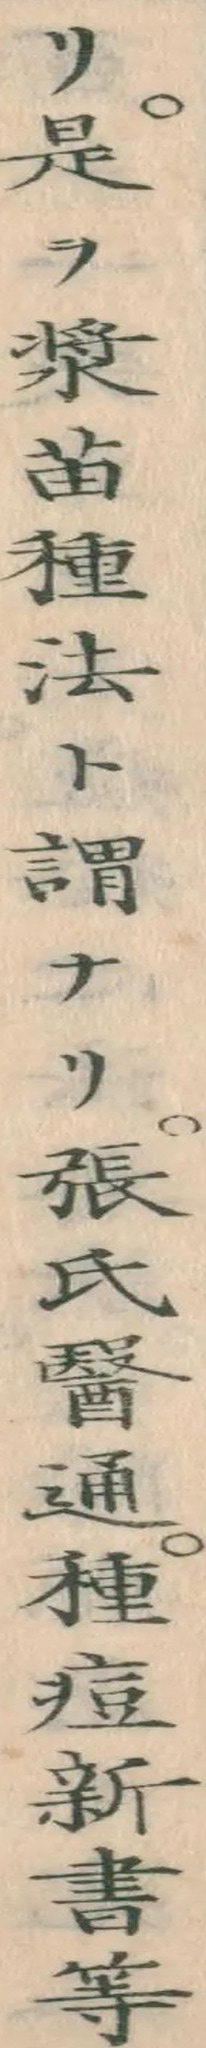リ。是ヲ漿苗種法ト謂ナリ。張氏医通。種痘新書等
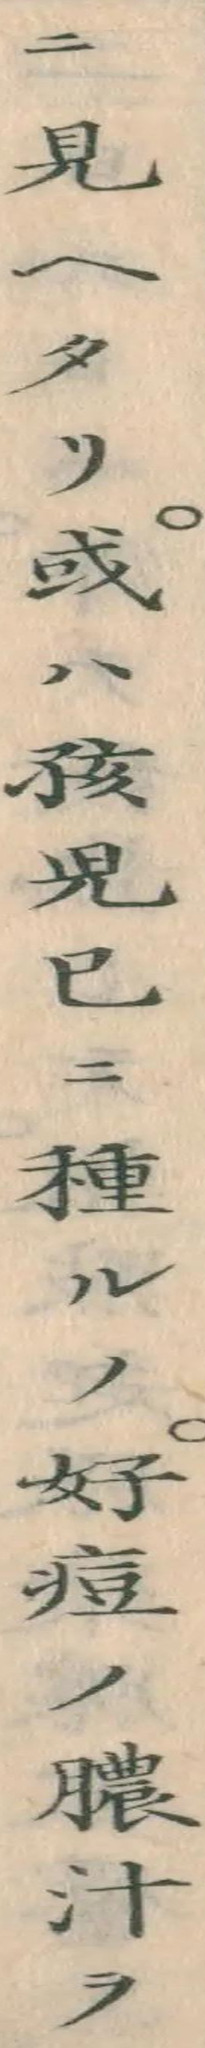ニ見ヘタリ。或ハ孩児已ニ種ルノ。好痘ノ膿汁ヲ
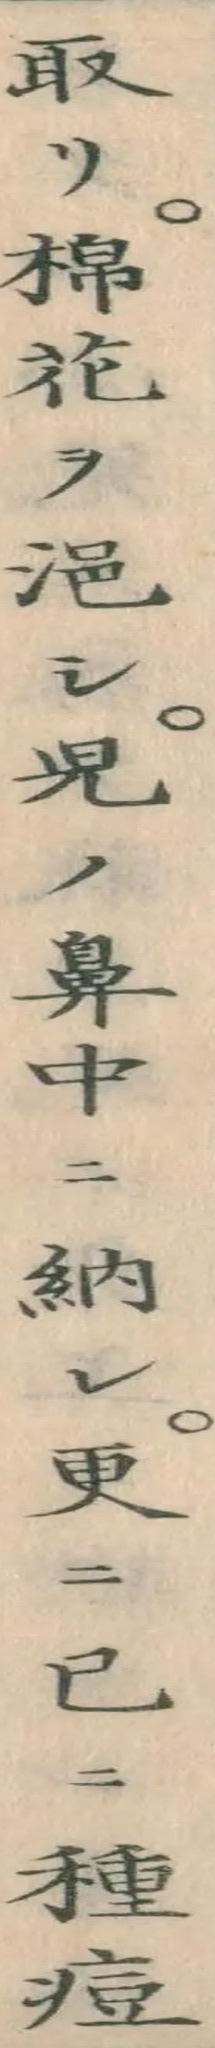取リ。棉花ヲ浥シ。児ノ鼻中ニ納レ。更ニ已ニ種痘

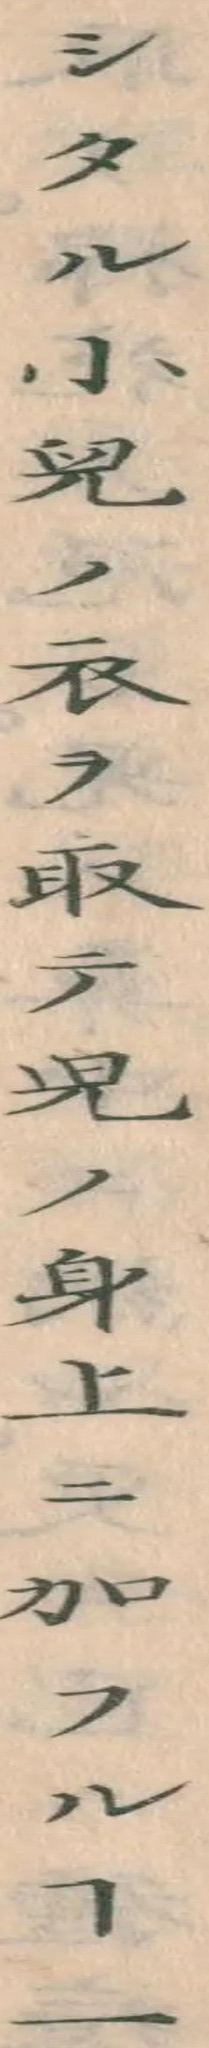シタル小児ノ衣ヲ取テ児ノ身上ニ加フルヿ一
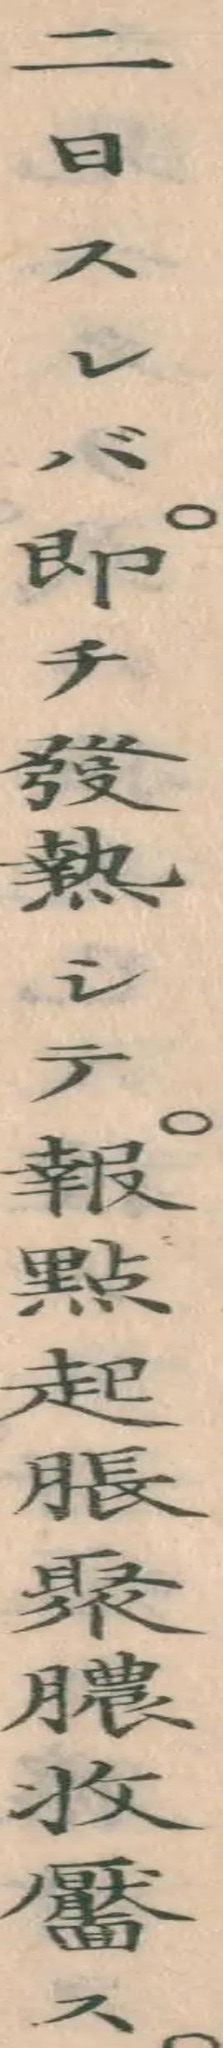二日スレバ。即チ発熱シテ。報点起脹聚膿収靨ス。
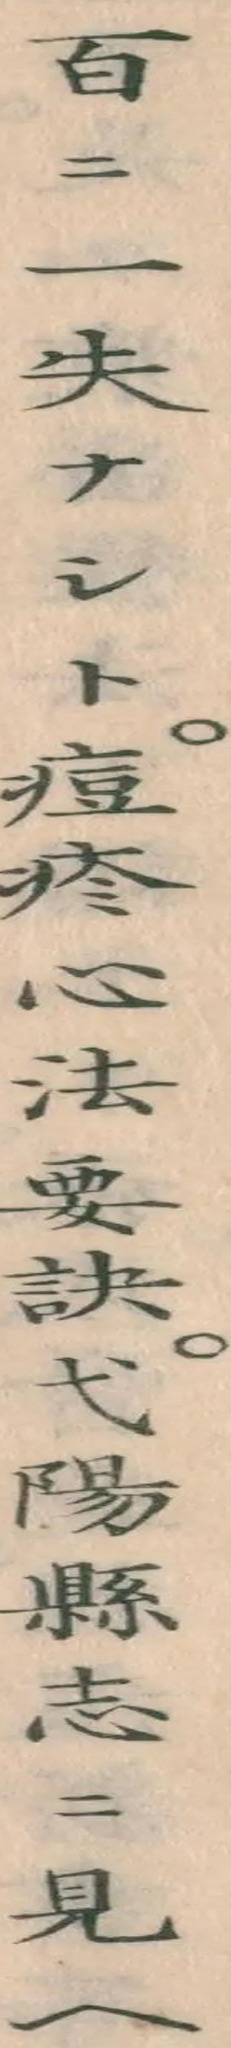百ニ一失ナシト。痘疹心法要訣。弋陽県志ニ見ヘ
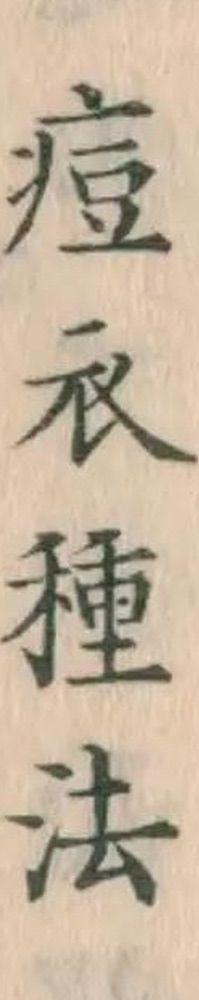痘衣種法
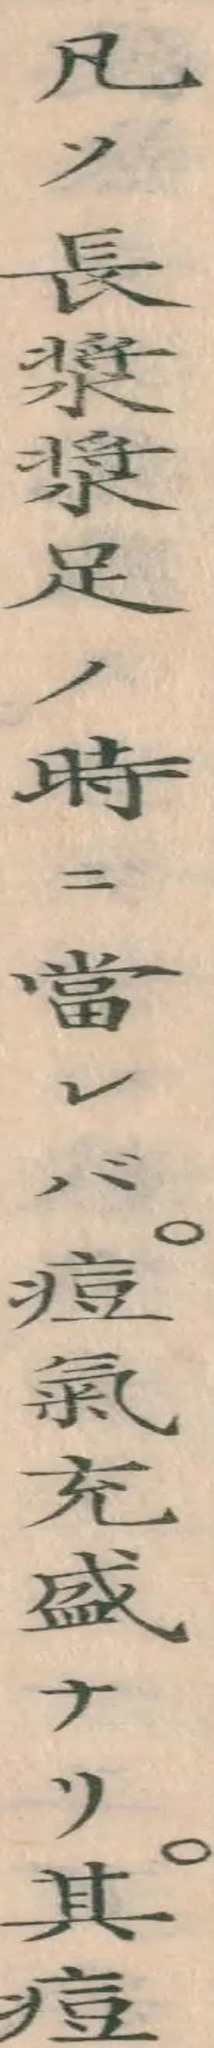凡ソ長漿漿足ノ時ニ当レバ。痘気充盛ナリ。其痘
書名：種痘弁義
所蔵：国立国会図書館 National Diet Library, JAPAN
